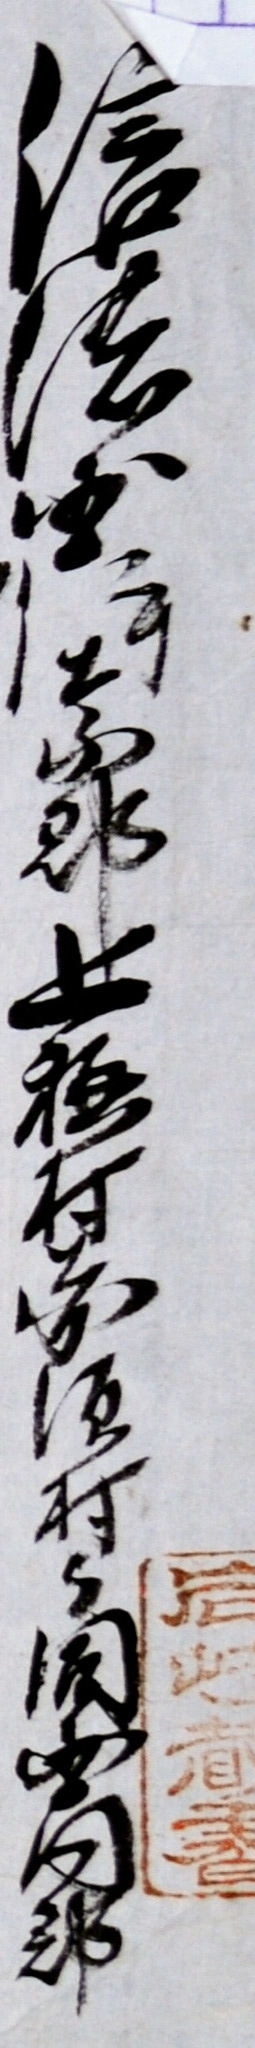信濃国伊奈郡上穂村赤須村与同国同郡
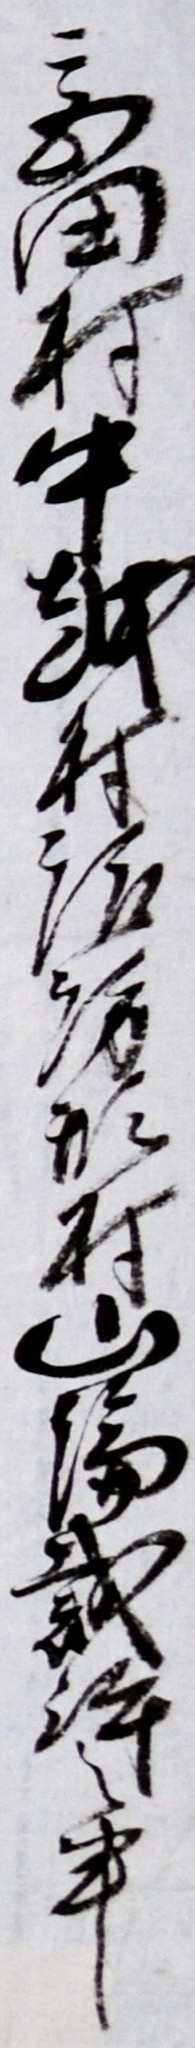宮田村中越村諏訪形村山論裁許之事
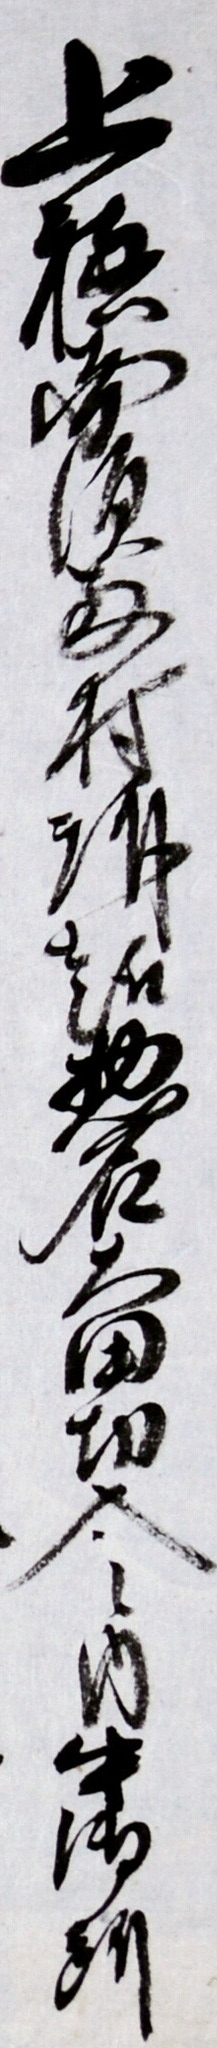上穂赤須両村訴趣惣名太田切入之内中御所
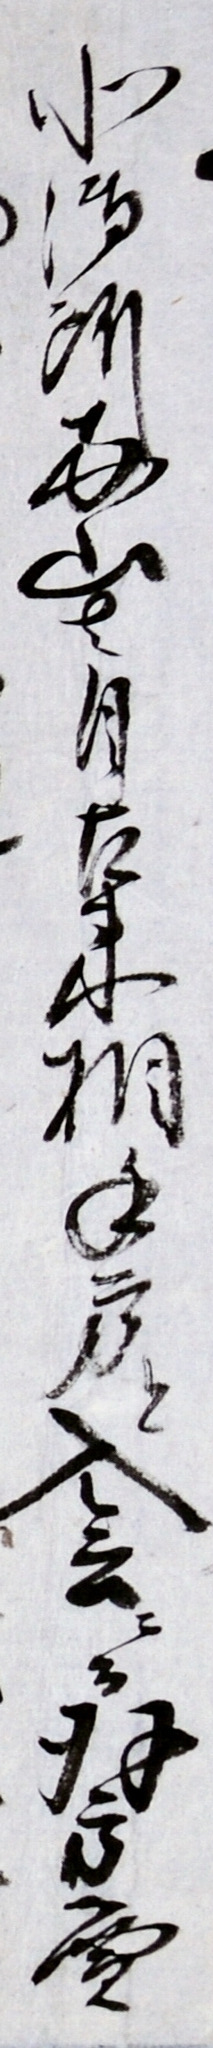北御所両山者自古来相手方と入会二而双方売
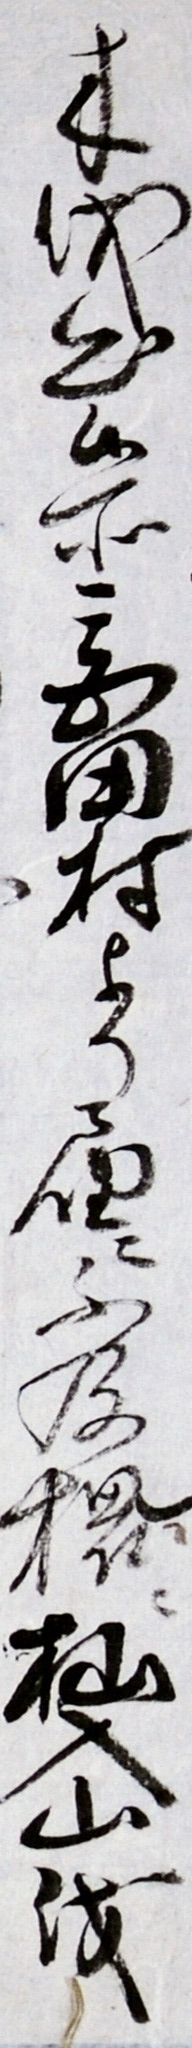木伐出候所宮田村より届ニ不及猥ニ杣入山伐
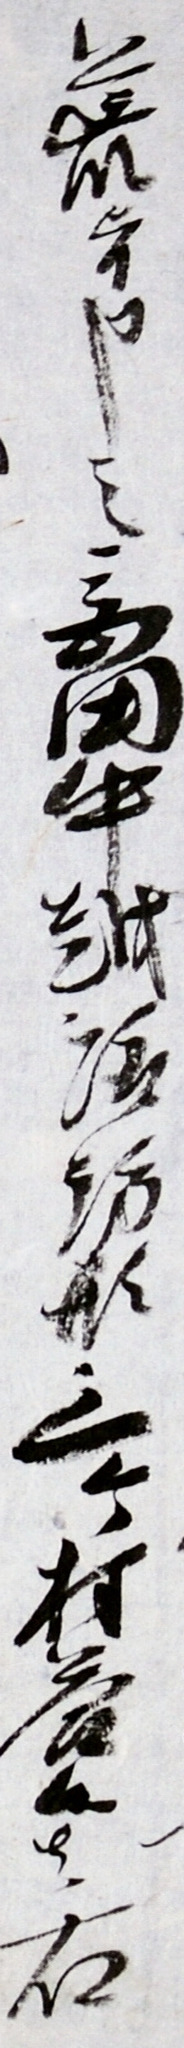荒旨申之宮田中越諏訪形三ケ村答候者右
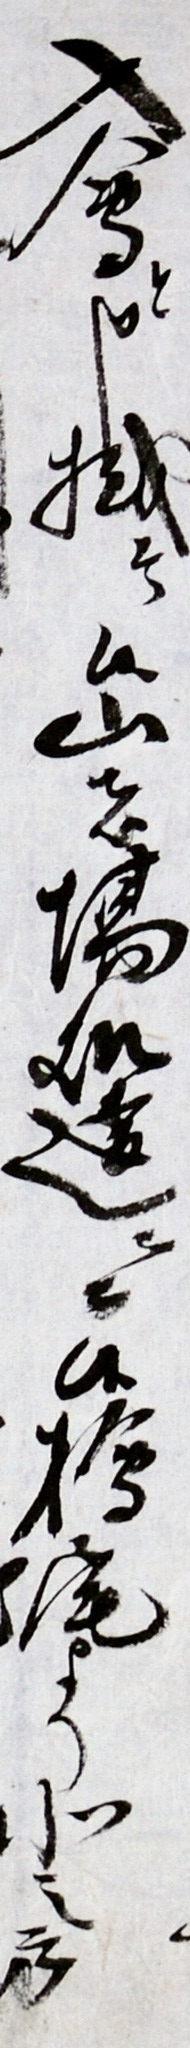入会と申掛ヶ候山者場処違ニ而候檜尾より北之方
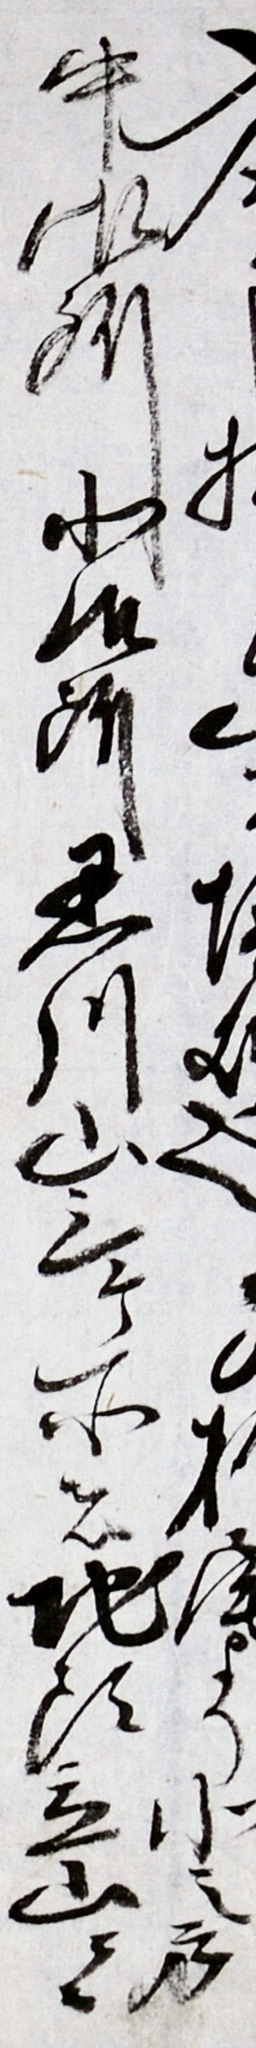中御所北御所黒川山三ケ所者地頭立山二而
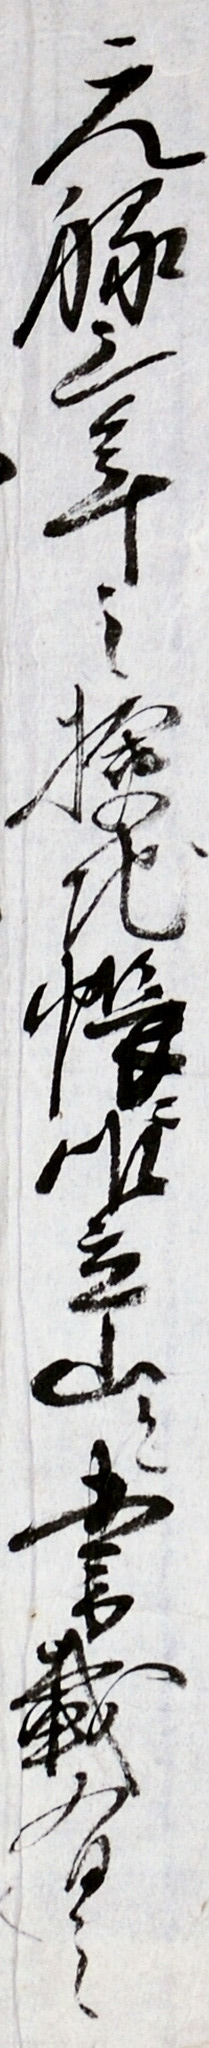元禄三年之検地帳ニ御立山と書載有之
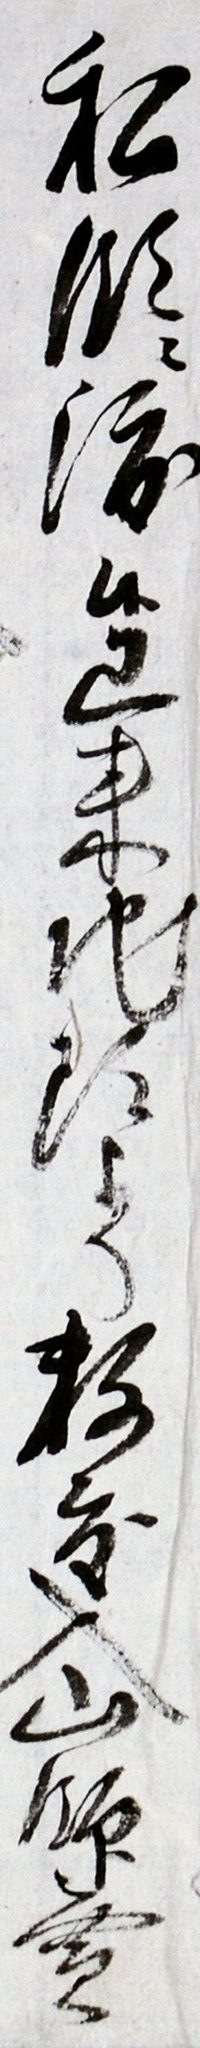私領二渡候己来地頭より数度入山師売
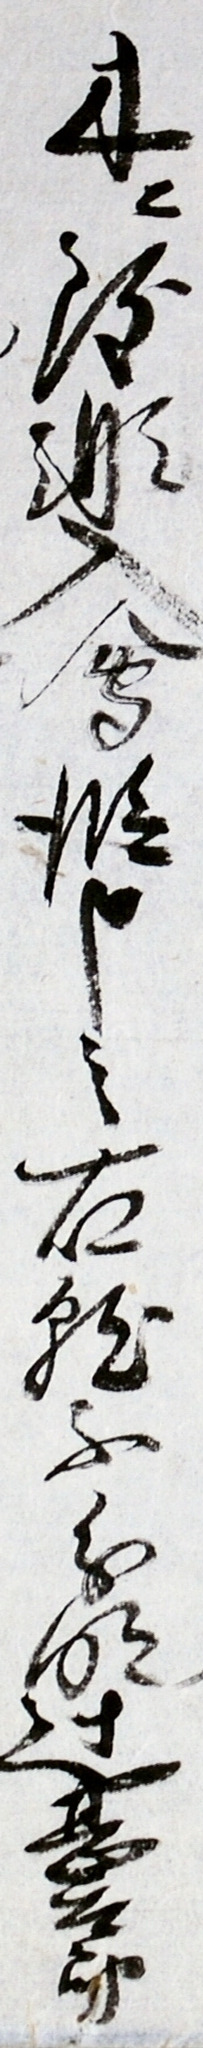木ニ致非入会縦申之右就不分明辻甚太郎
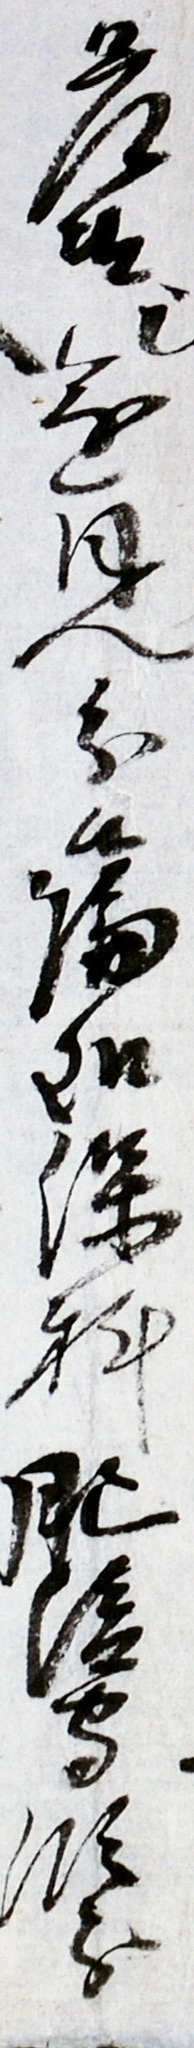差出し遂見分候論処保科肥後守領分
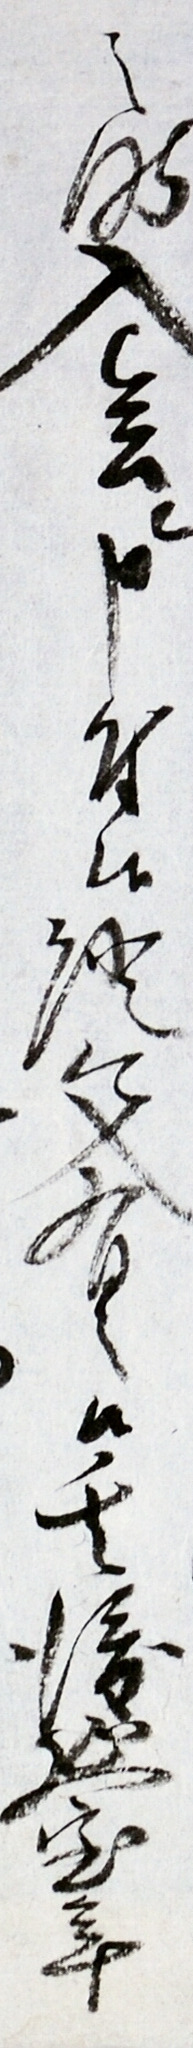之時入会ニ申付候證文有之候其後延宝年
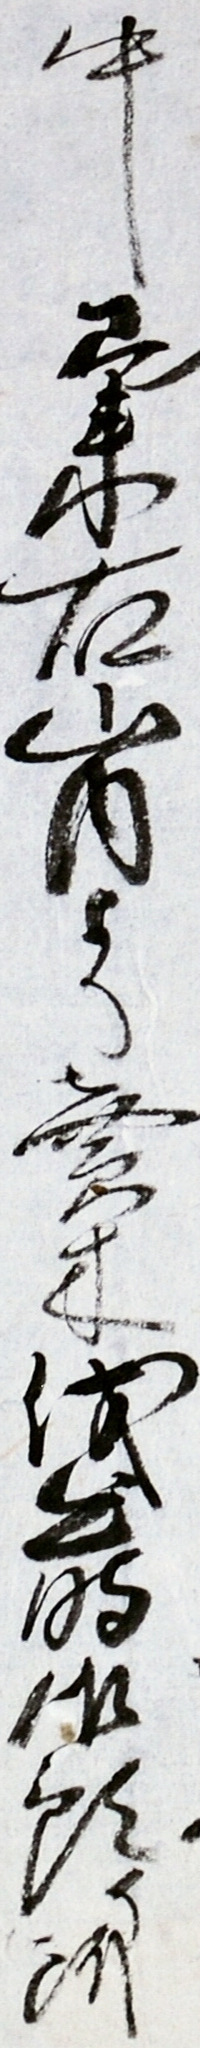中己来右山内より売木伐出時御預り所
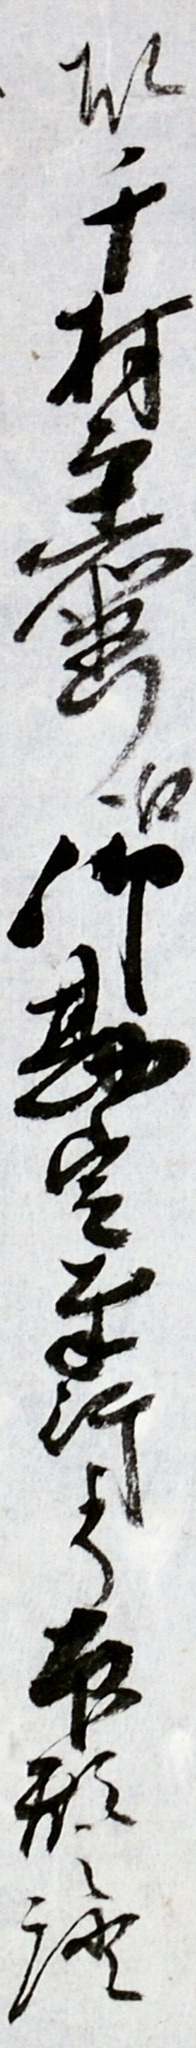故千村平右衛門江御勘定奉行より印形之證
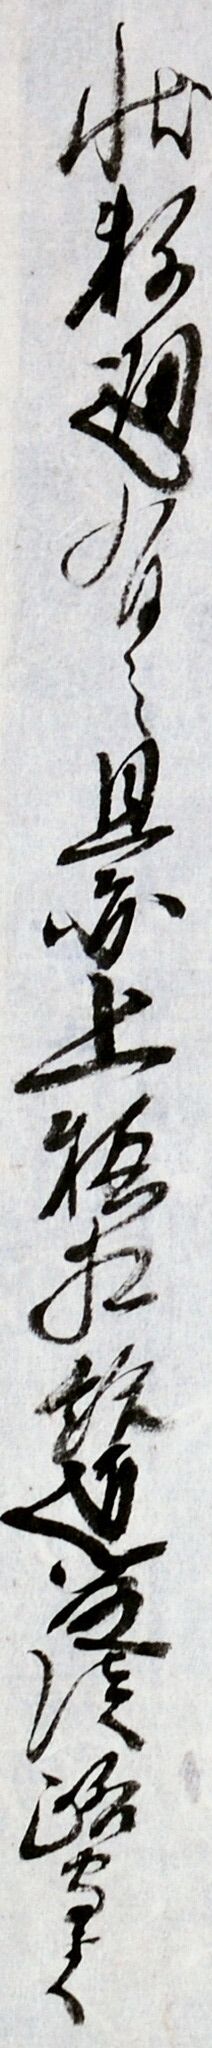状数通有之且亦上穂相給近藤淡路守より
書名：赤穂宮田山論裁許状
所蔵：伊那市立高遠町図書館・合同会社AMANE
